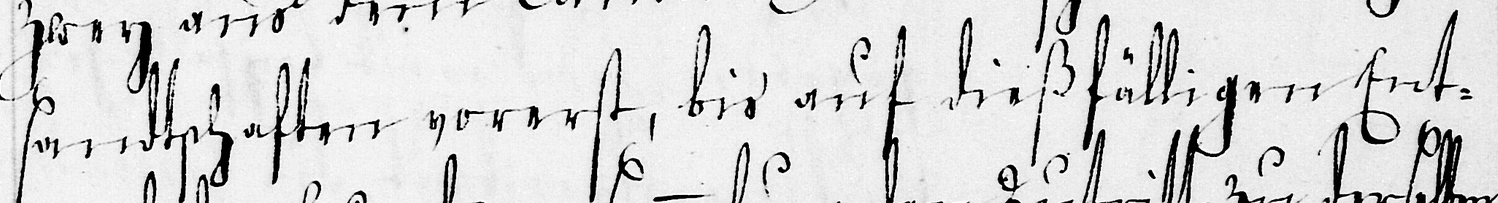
sandtschaften vorerst, bis auf dießfälligen Ent¬
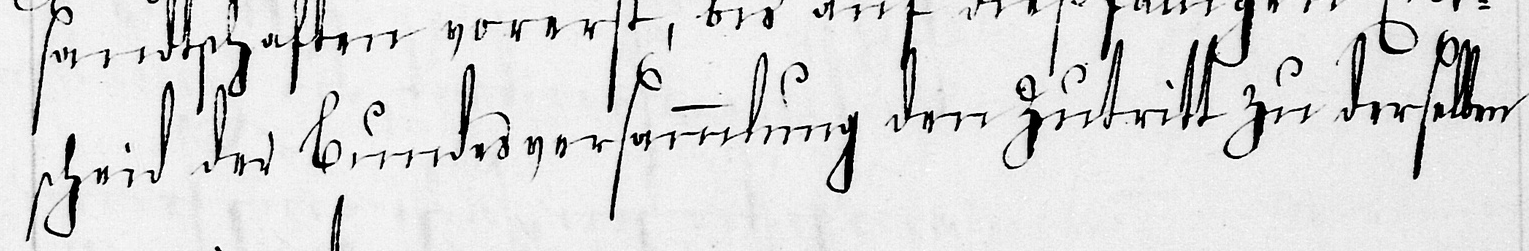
scheid der Bundesversammlung den Zutritt zu derselb¬
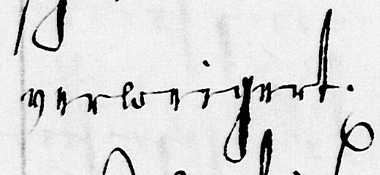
verweigert.
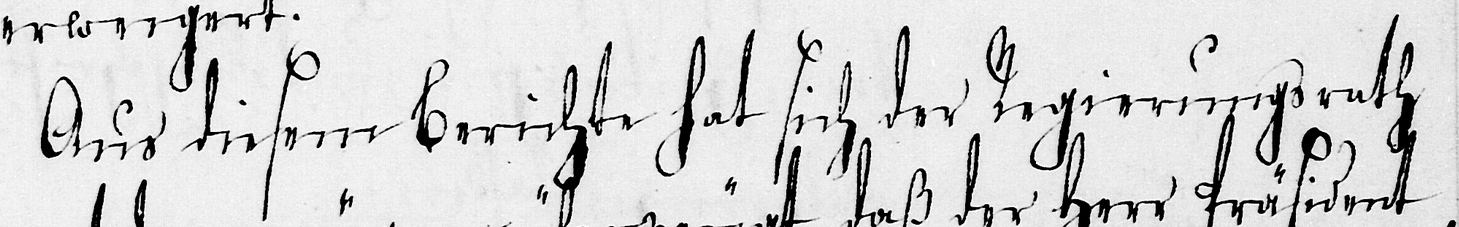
Aus diesem Berichte hat sich der Regierungsrath
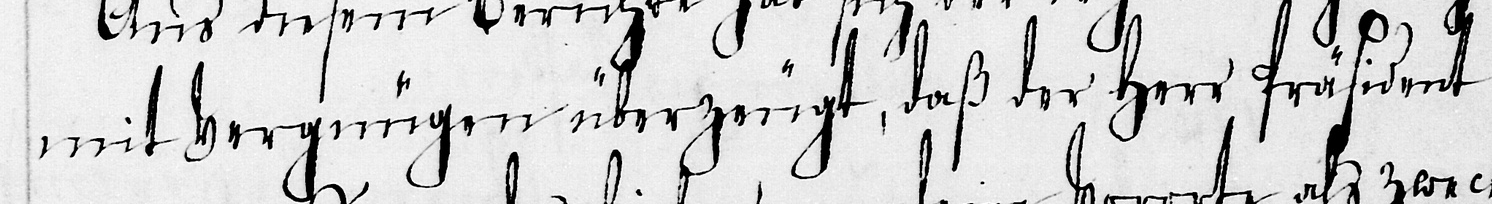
mit Vergnügen überzeugt, daß der Herr Präsident
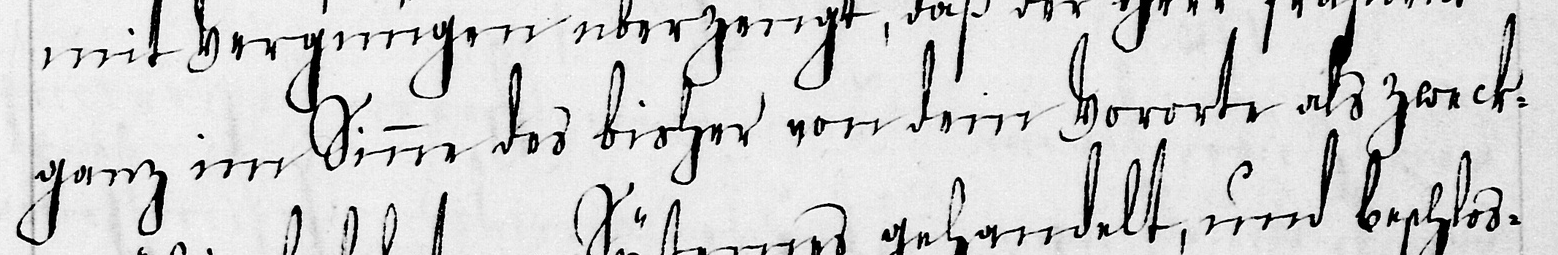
ganz im Sinne des bisher von dem Vororte als zweck¬
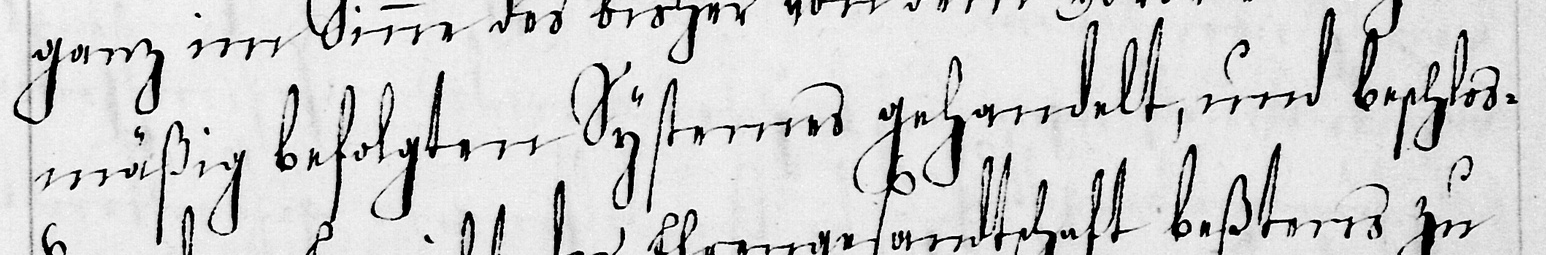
mäßig befolgten Systemes gehandelt, und beschloß¬
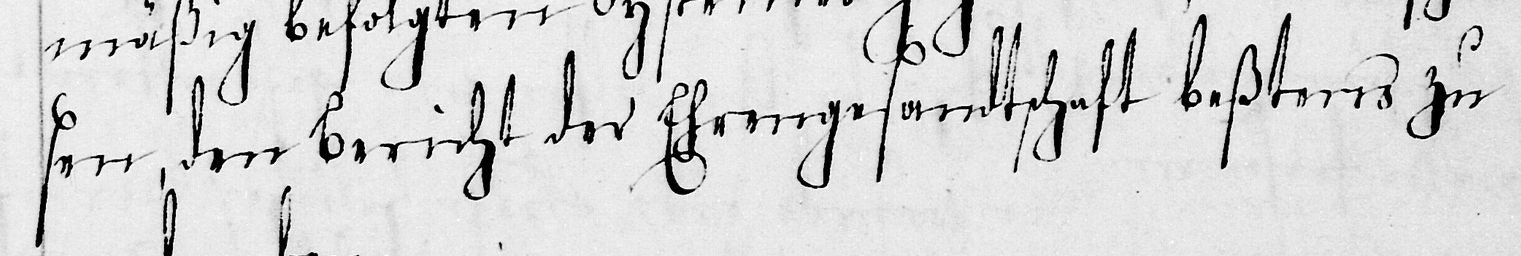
en, den Bericht der Ehrengesandtschaft beßtens zu
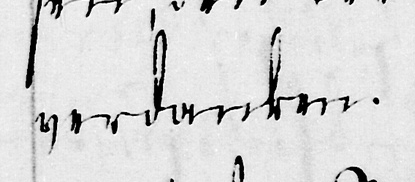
verdanken.
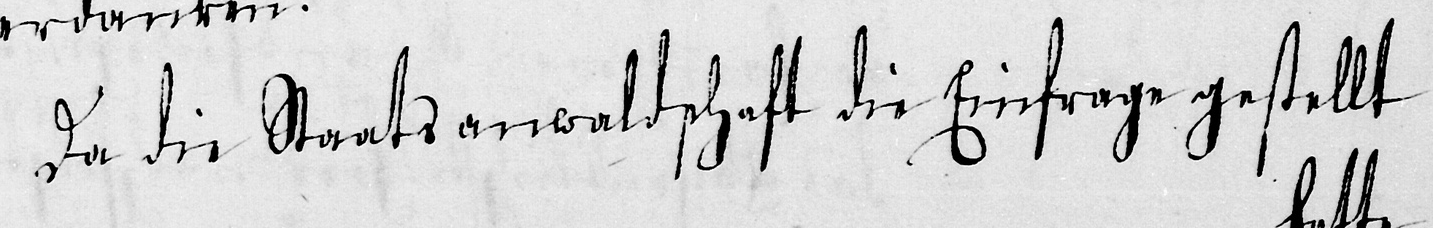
Da die Staatsanwaldschaft die Einfrage gestellt
